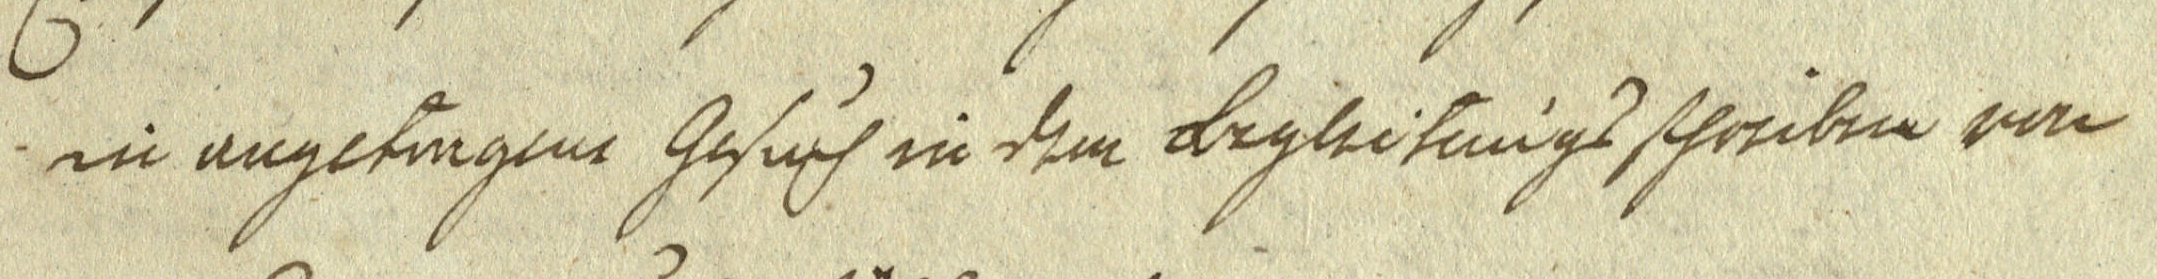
in angetragene Gesuch in dem Begleitungsschreiben von
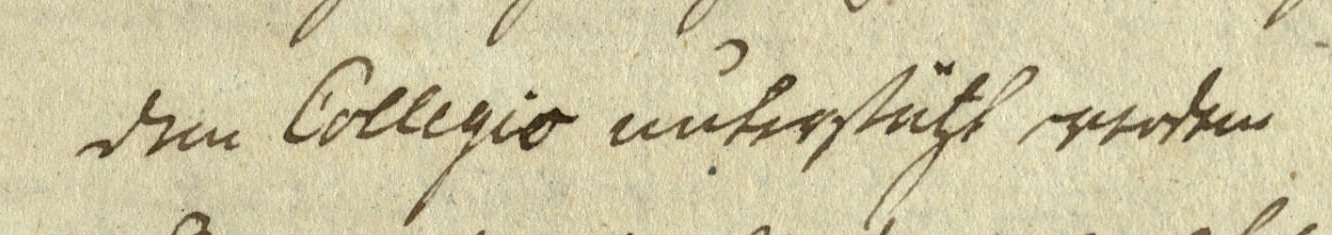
dem Collegio unterstützt werden.
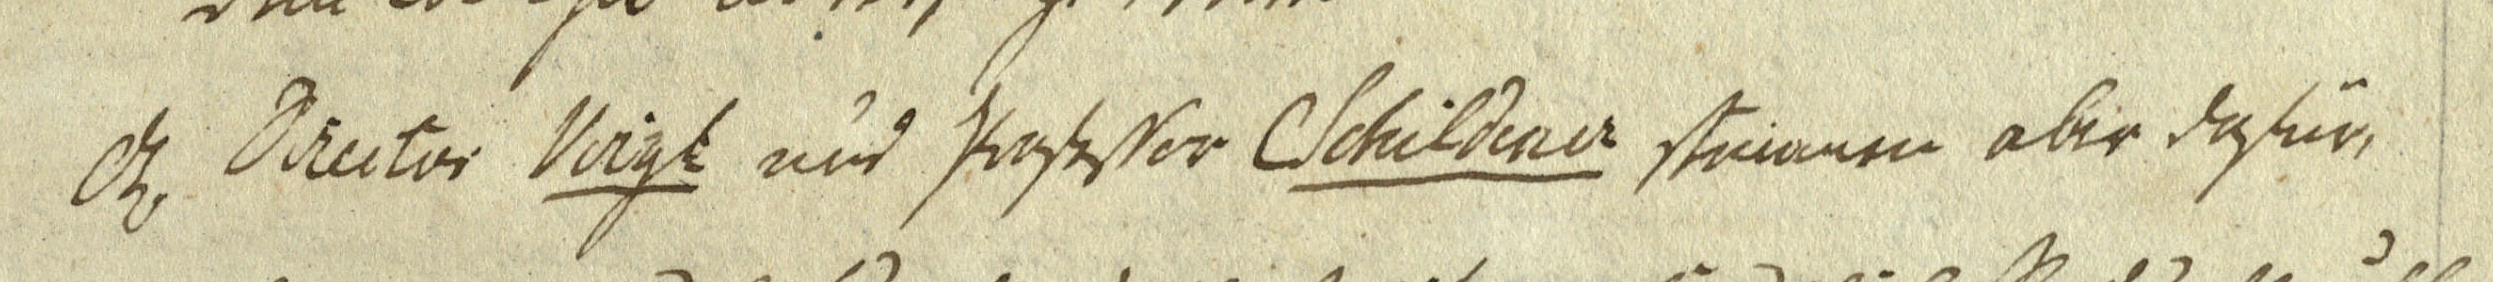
dh., Director Voigt und Professor Schildener stimmen aber dafür,
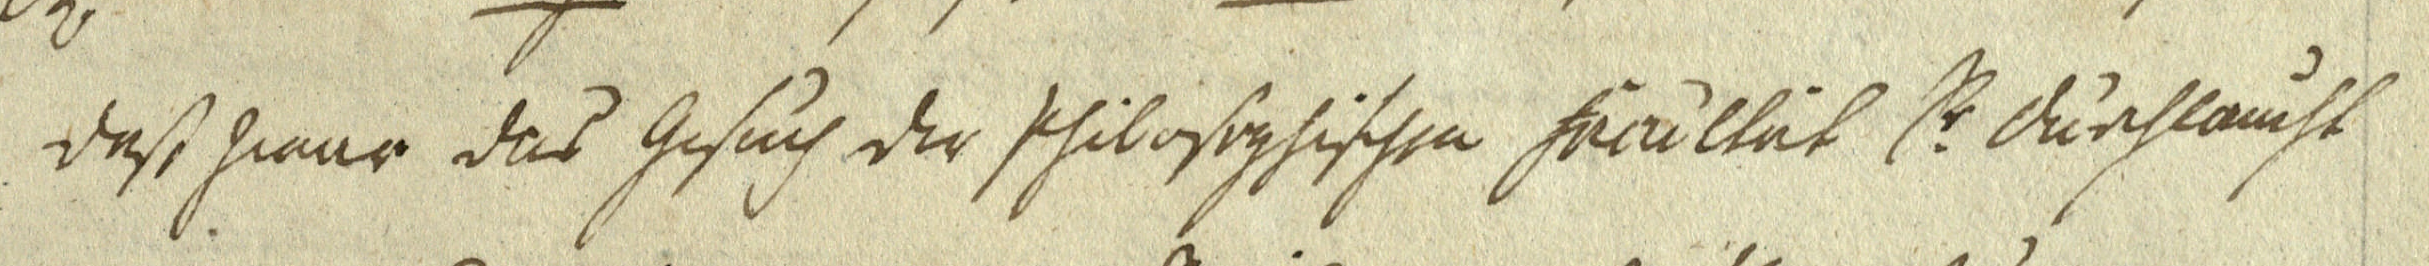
daß zwar das Gesuch der Philosophischen Facultät Sr Durchlaucht
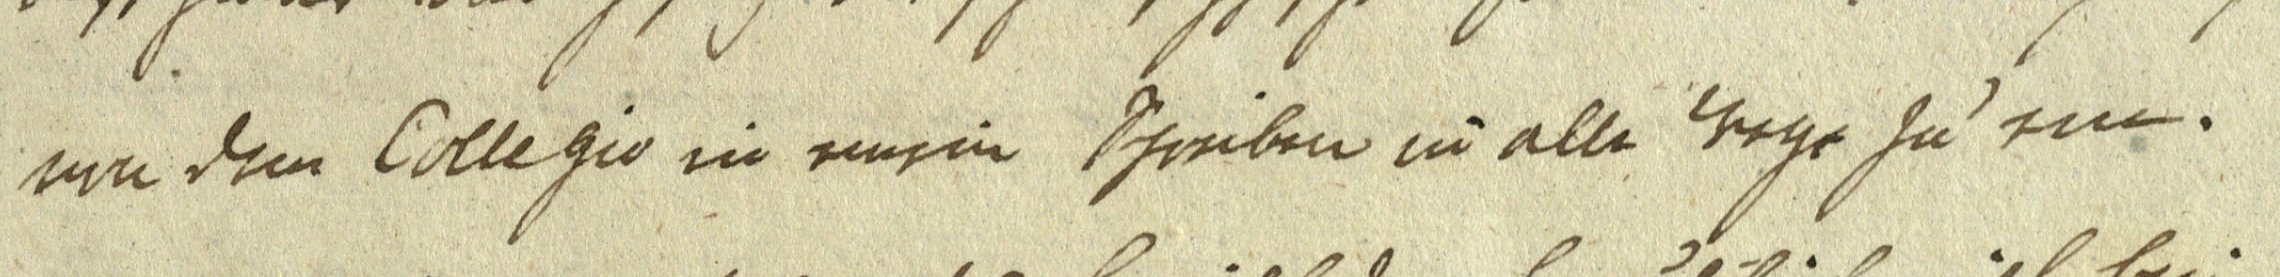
von dem Collegio in einem Schreiben in alle Wege zu em¬
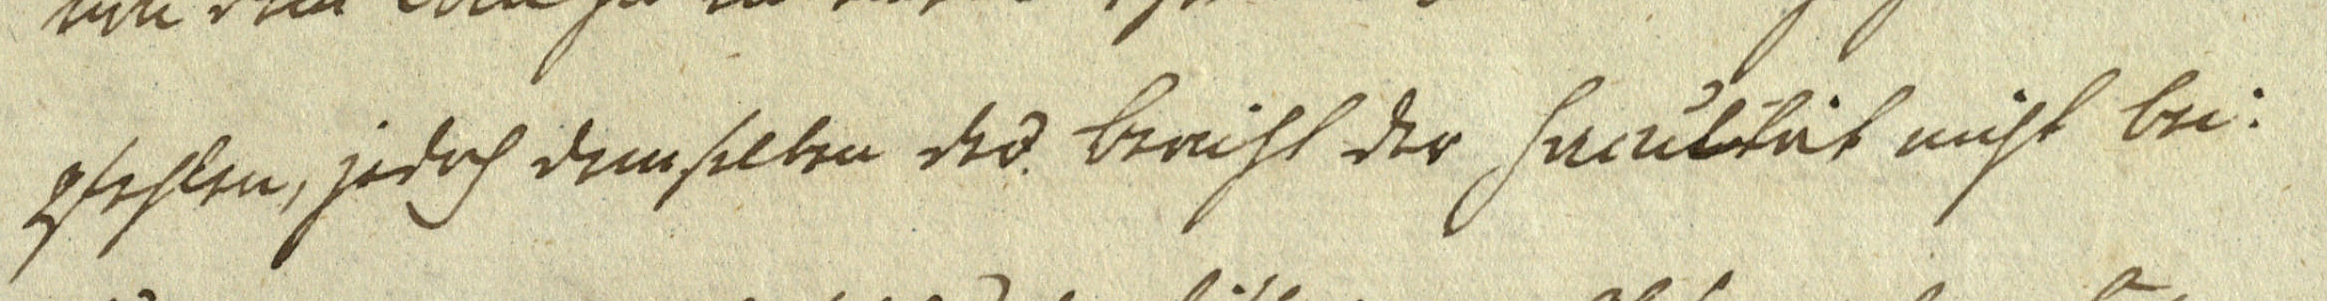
pfehlen, jedoch demselben der Bericht der Facultät nicht bei¬
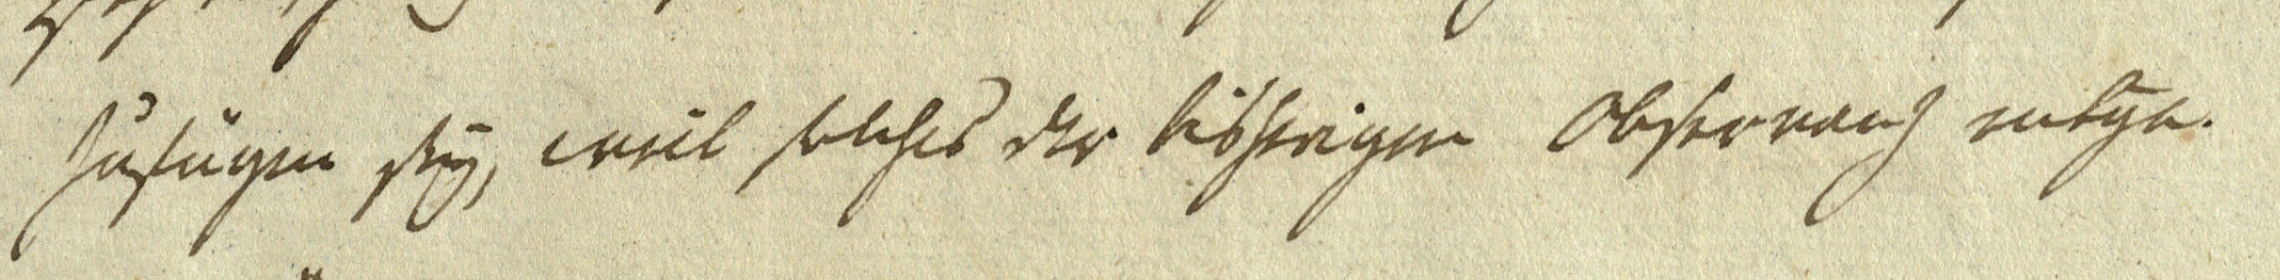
zufügen seÿ, weil solches der bisherigen Observanz entge¬
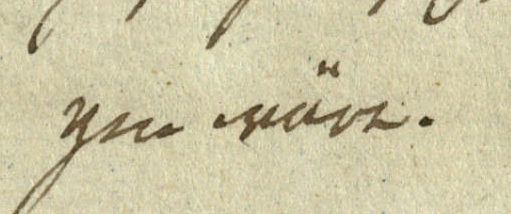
gen wäre.
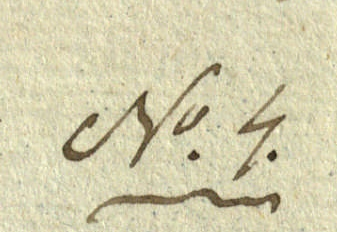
N° 4.
